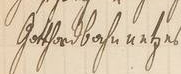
habe ich am
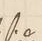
10
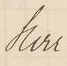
Sept.
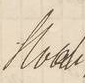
Herrn
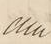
Maraini
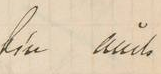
bin auch
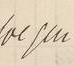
dass der
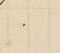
Brief
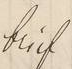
Heute
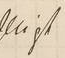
ich
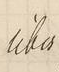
Herrn
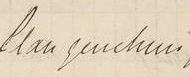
Plangenehmigungen
